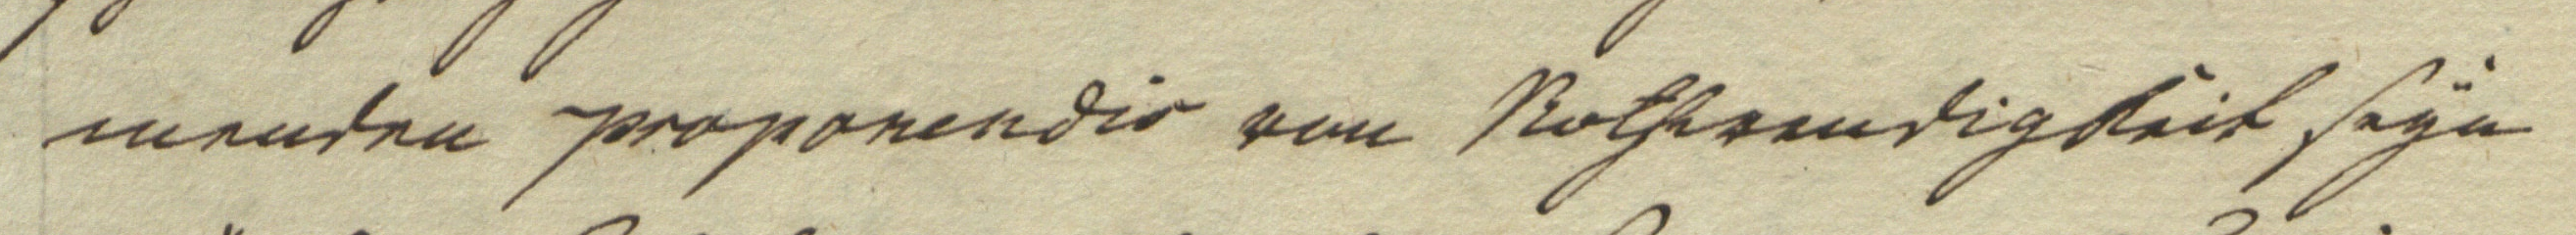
menden proponendis von Nothwendigkeit seÿn
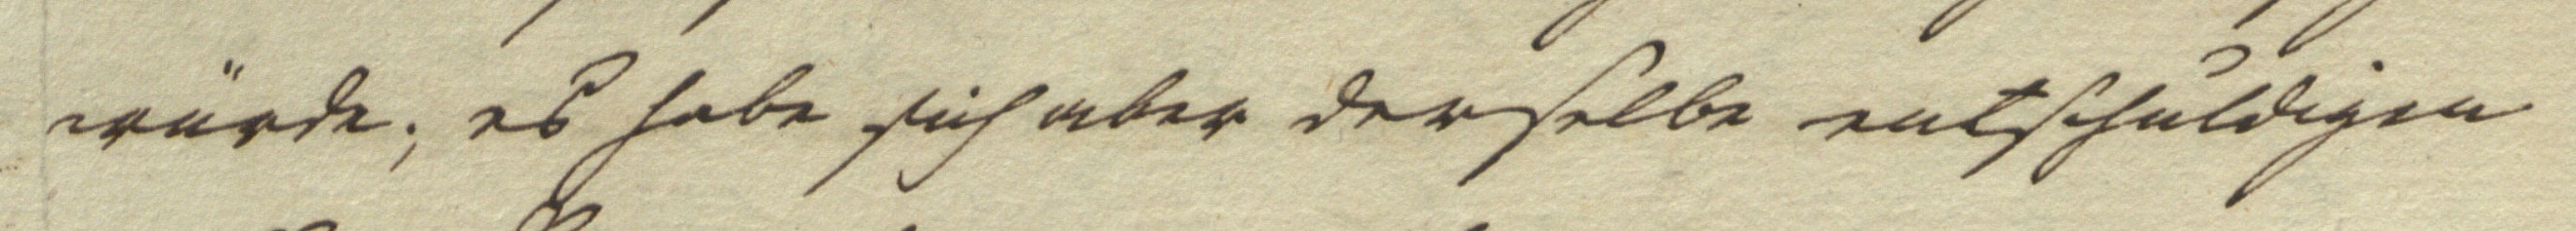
würde; es habe sich aber derselbe entschuldigen
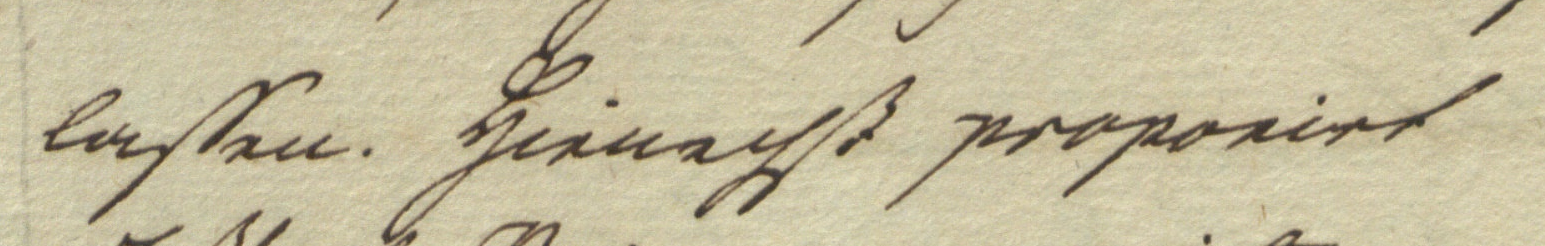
lassen. Hienechst proponirt
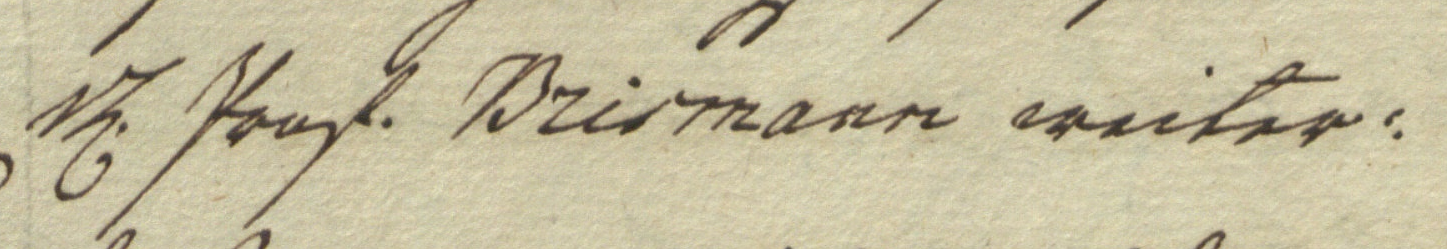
dh. Prof. Brismann weiter:
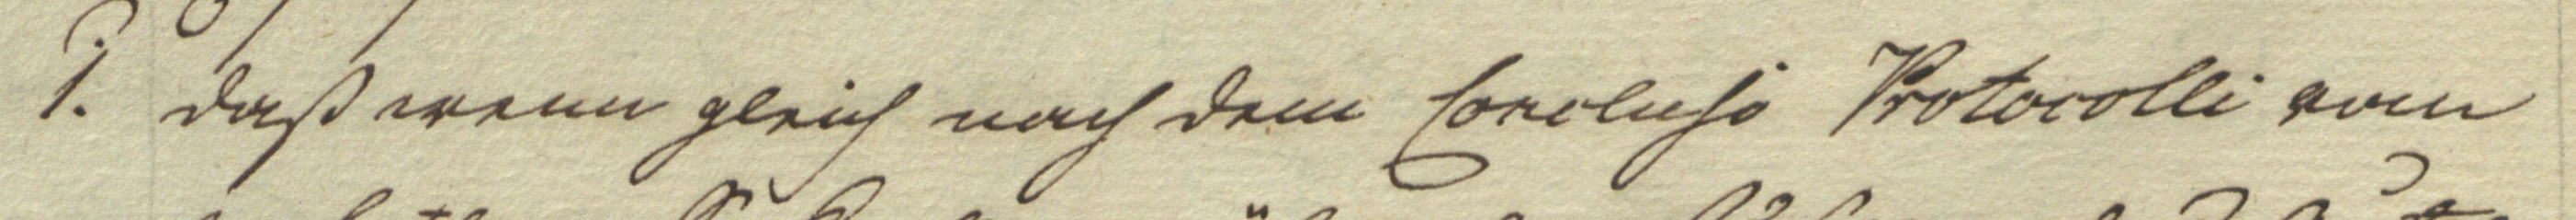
1. daß wenn gleich nach dem Concluso Protocolli vom
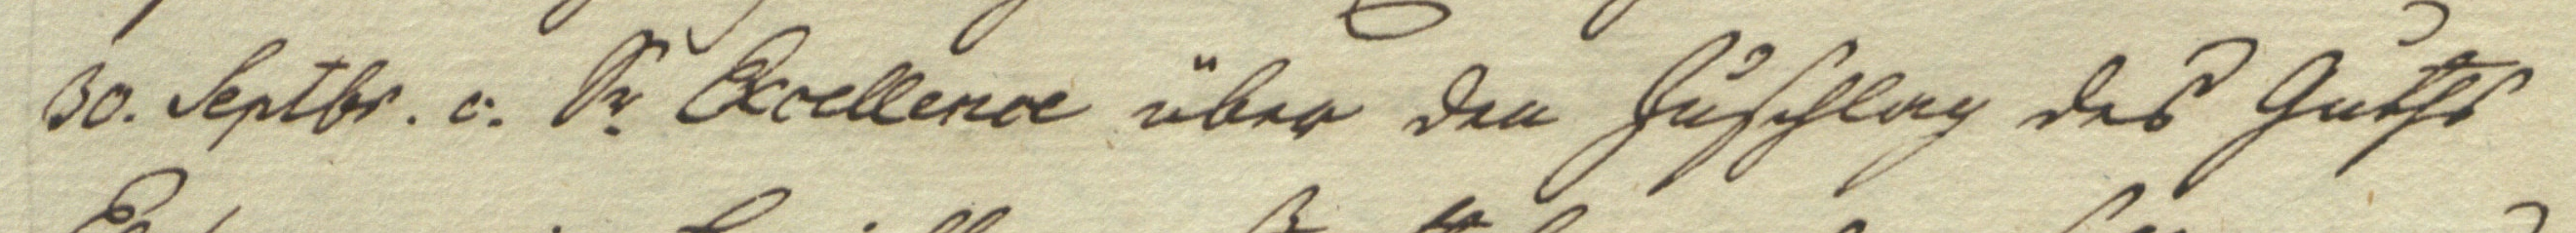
30. Septbr. c. Sr Excellence über den Zuschlag des Guths
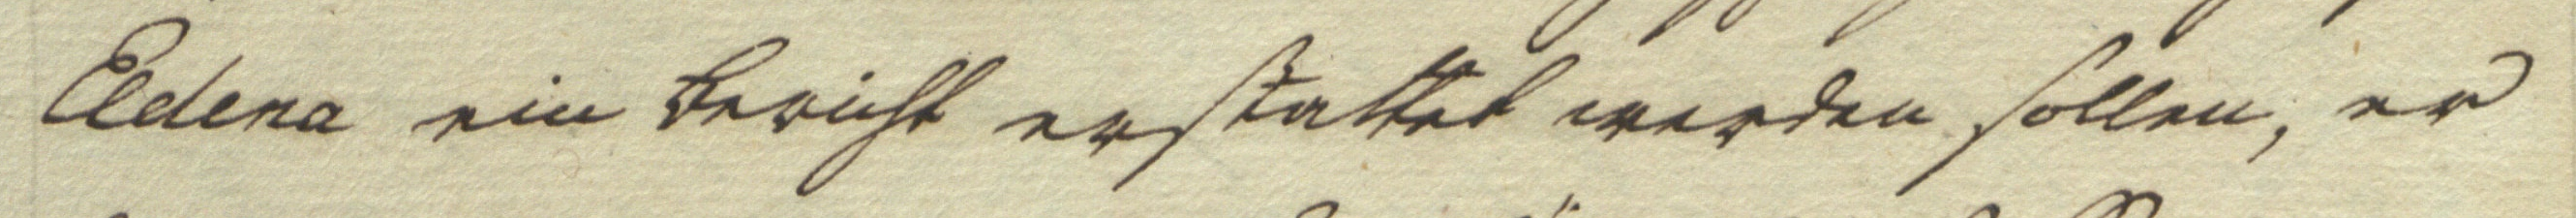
Eldena ein Bericht erstattet werden sollen, er
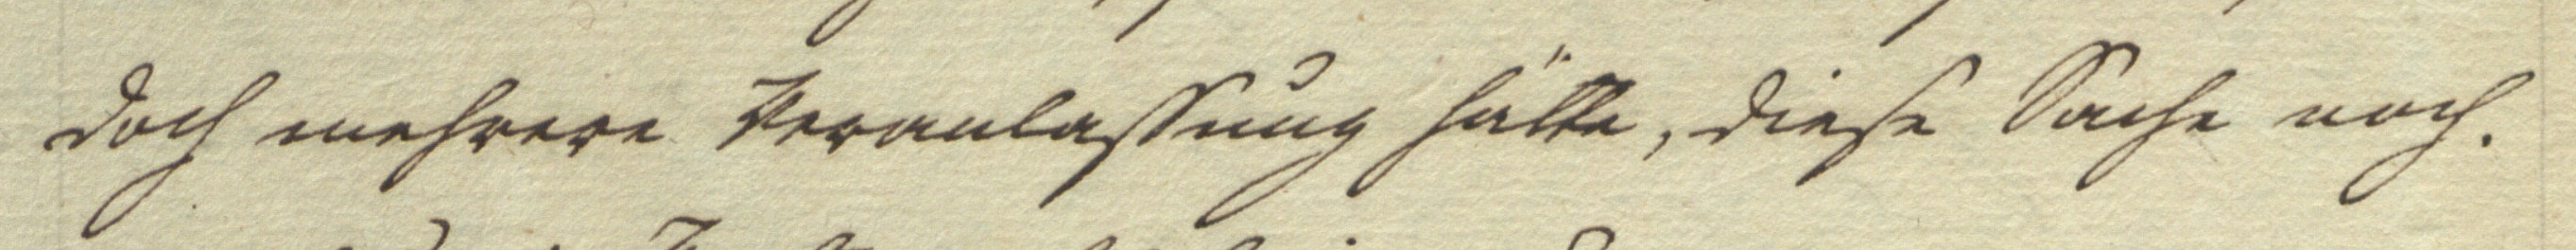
doch mehrere Veranlassung hätte, diese Sache noch¬
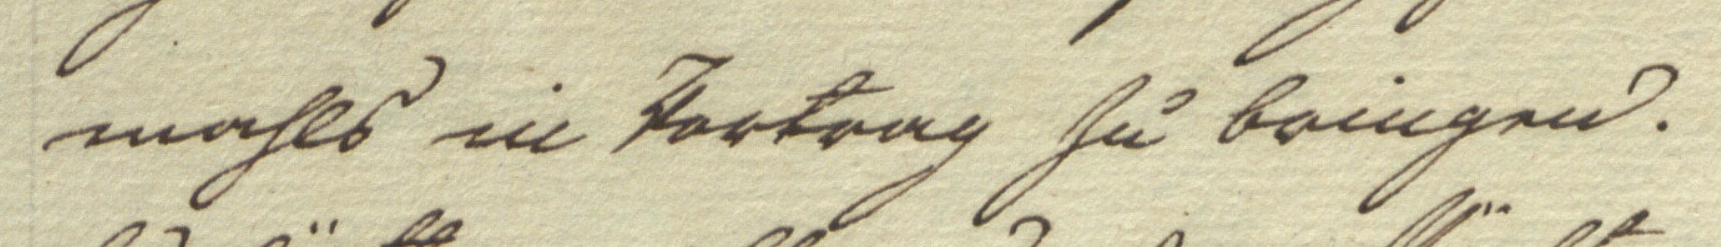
mahls in Vortrag zu bringen.
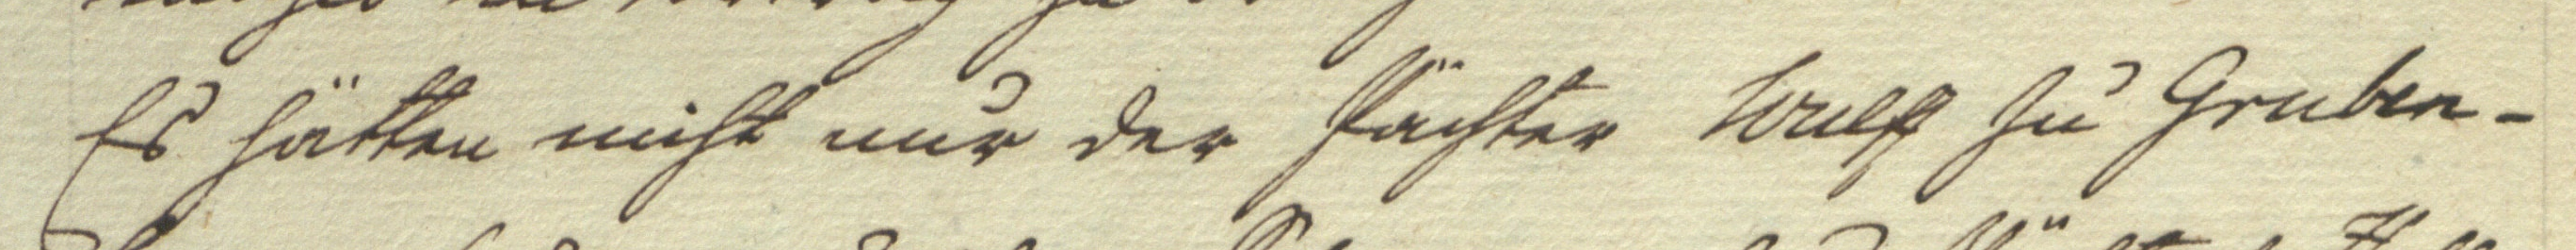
Es hätten nicht nur der Pächter Wulff zu Gruben¬
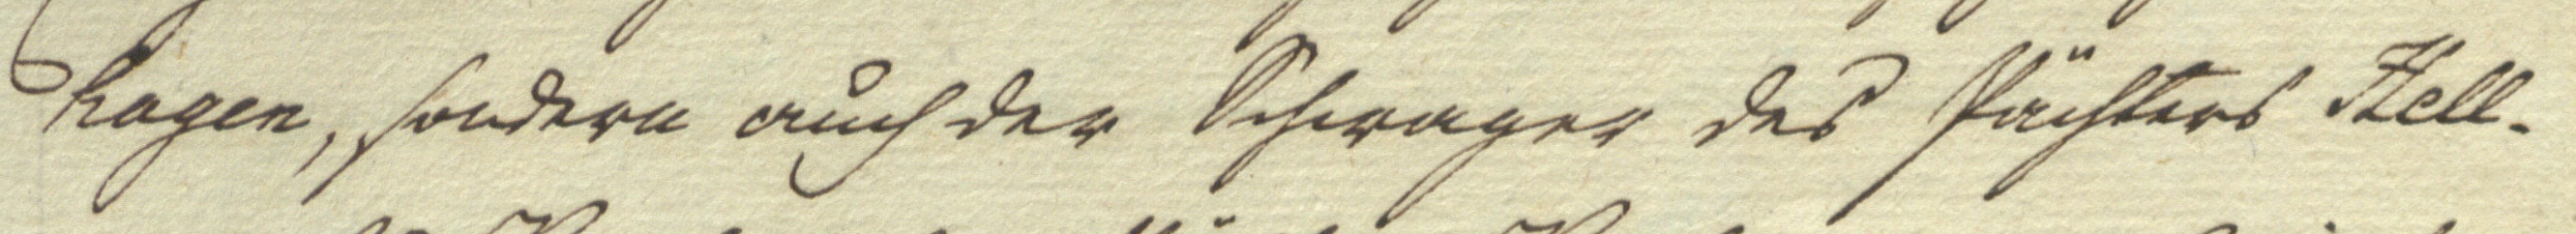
hagen, sondern auch der Schwager des Pächters Hell¬
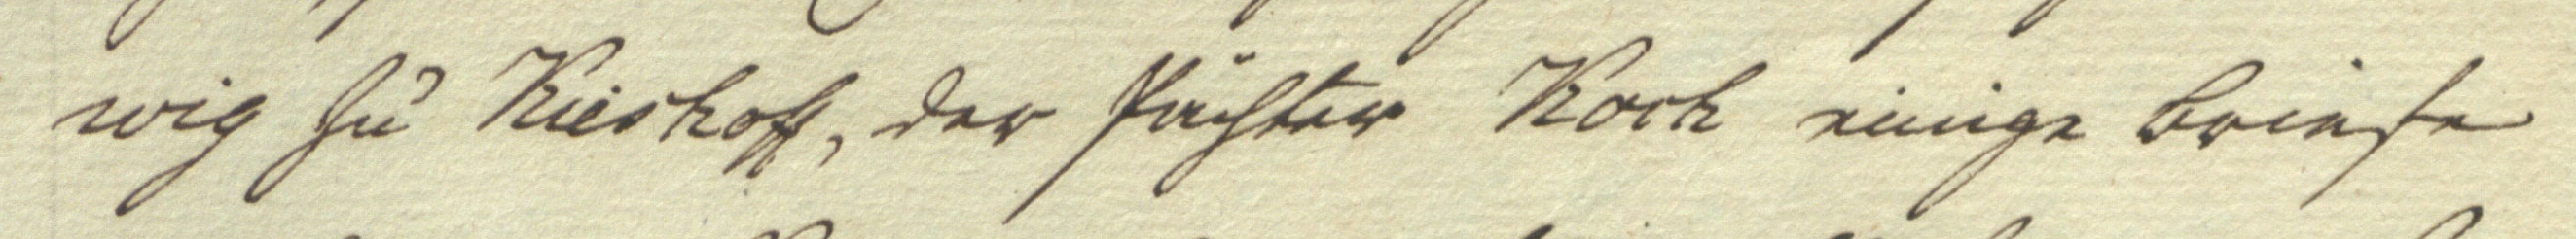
wig zu Kieshoff, der Pächter Koch einige Briefe
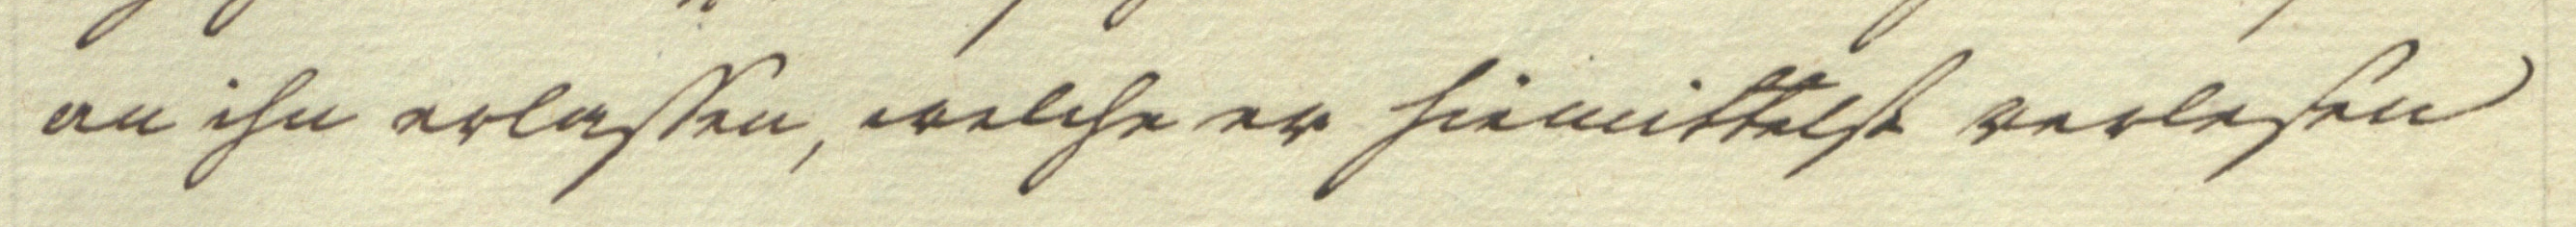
an ihn erlassen, welche er hiemittelst verlesen
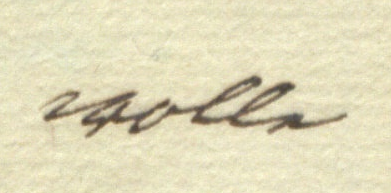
wolle
